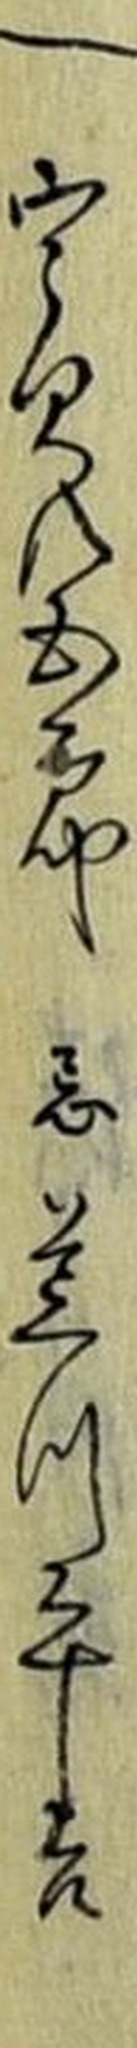宇貝八五郎忌並川平吉
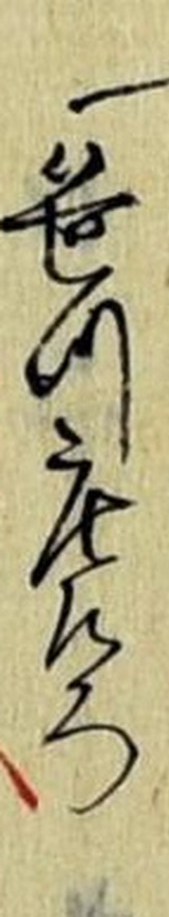笹川庄左衛門
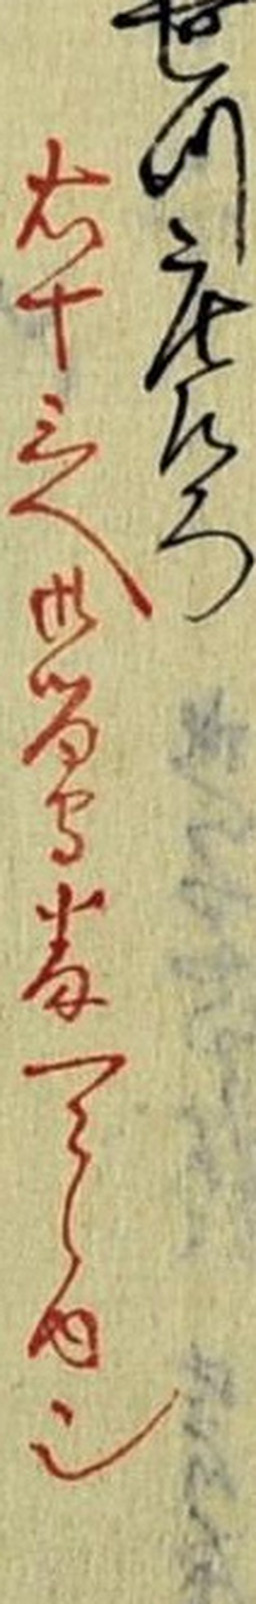右十三人御留守番可之内也
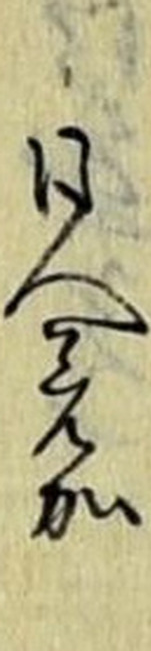同人差加
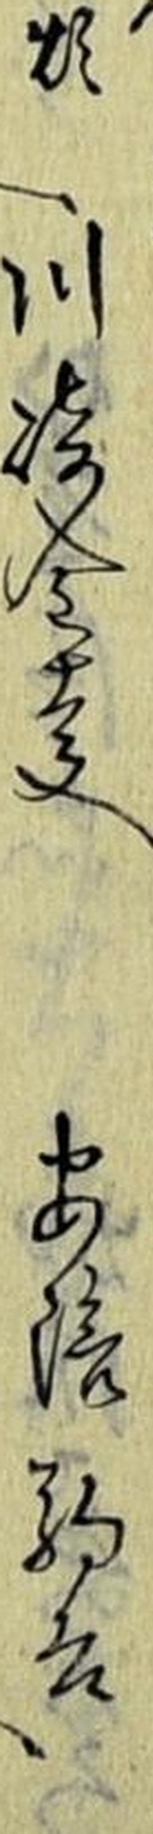煩河崎金太夫安倍駒吉
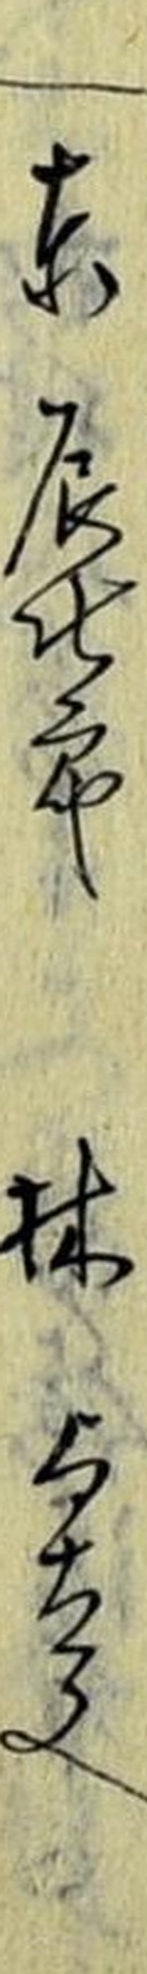東辰次郎林与太夫
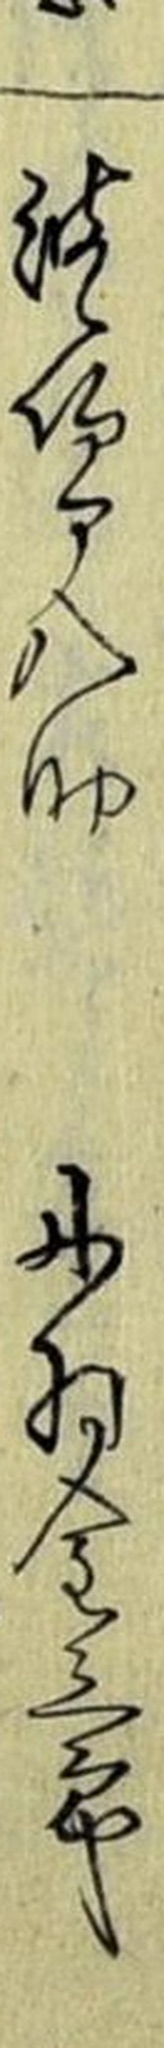忌波々伯部八助丹羽金三郎
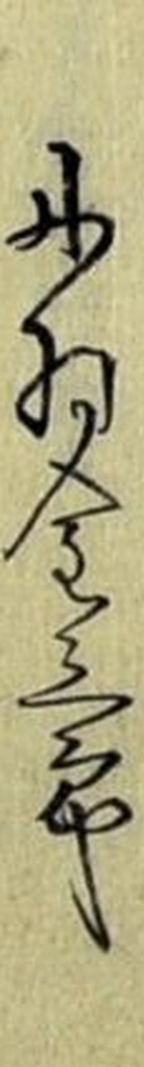高嶋金三郎
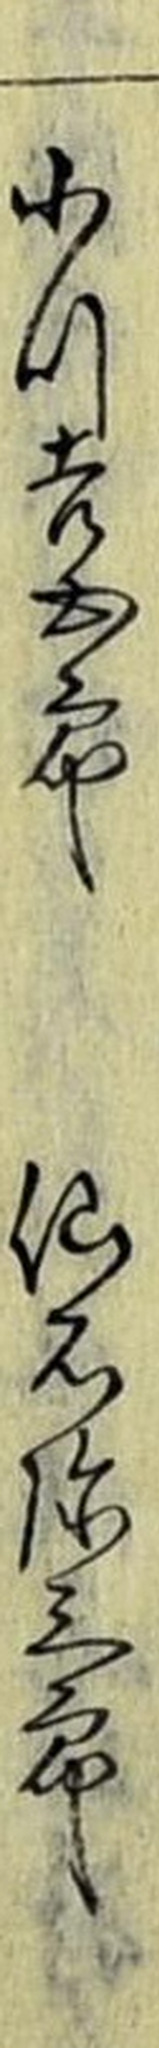小川吉五郎仙石弥三郎
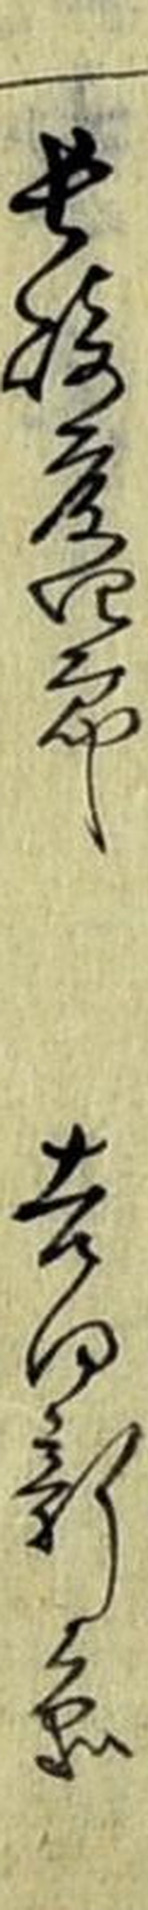長崎藤四郎吉田新兵衛
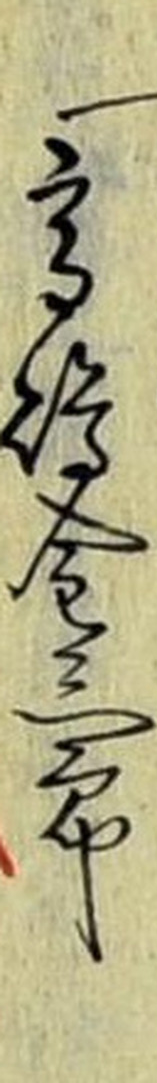高嶋金三郎
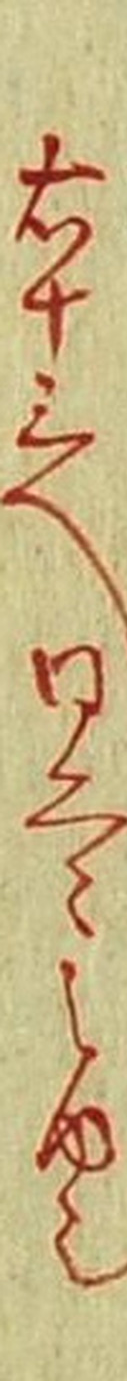右十三人同二々之内也
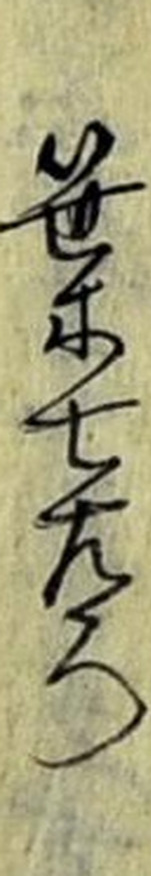笹川庄左衛門
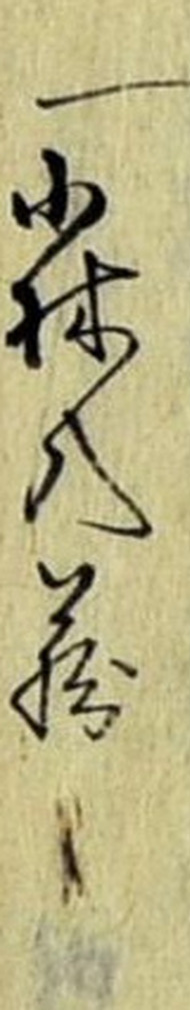小林八蔵

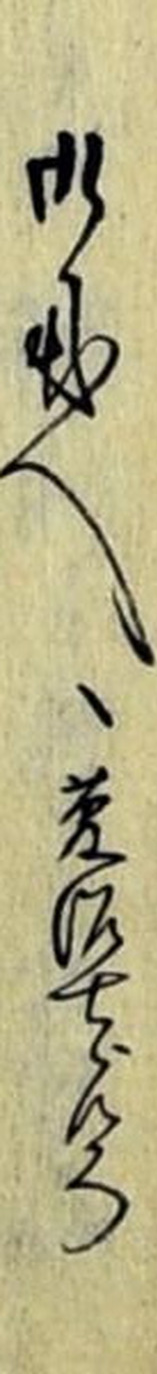御用人へ菅沼七郎左衛門
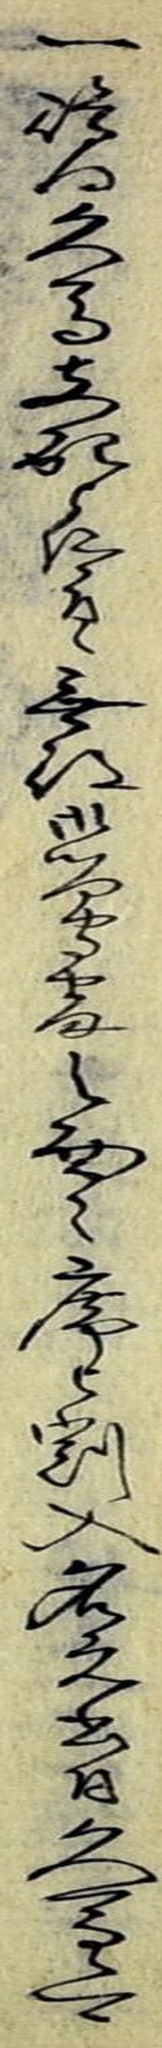一嶋田久馬支配被仰付候無役御留守番之面々席被割入名元書付久馬へ可
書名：命令之部 四
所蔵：福井県文書館 Fukui Prefectural Archives
